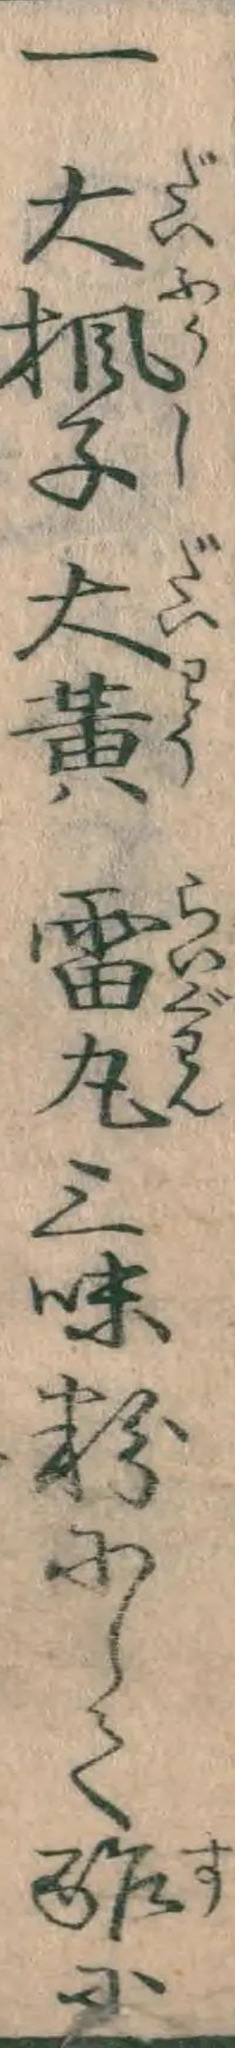一大楓子大黄雷丸三味粉にして酢に
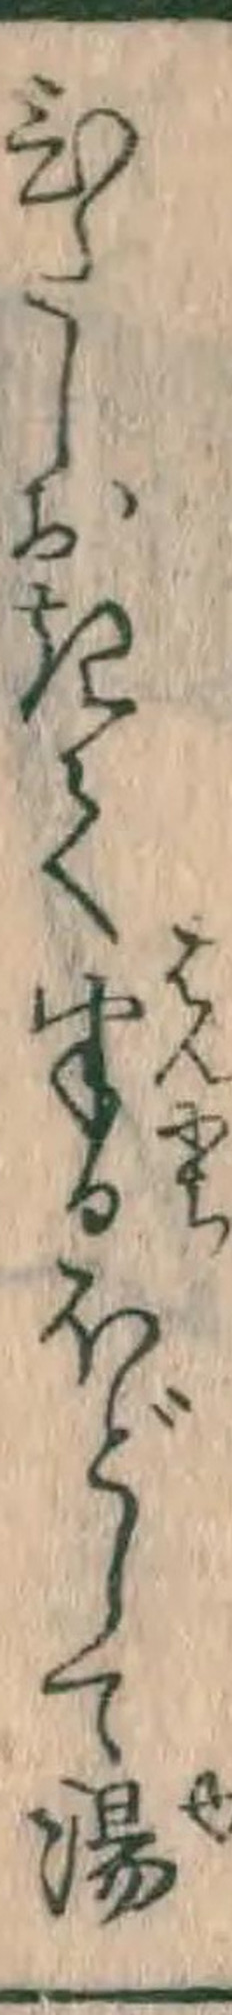ひたしおきて半日ほどして湯
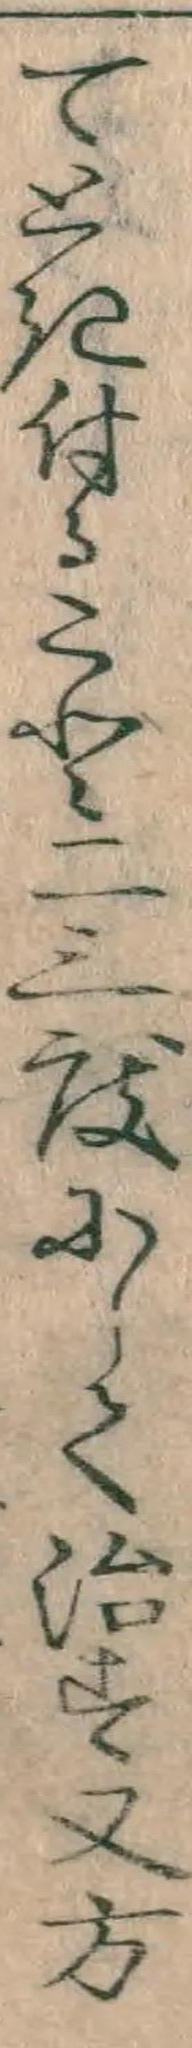てとき付ること二三度にして治す又方
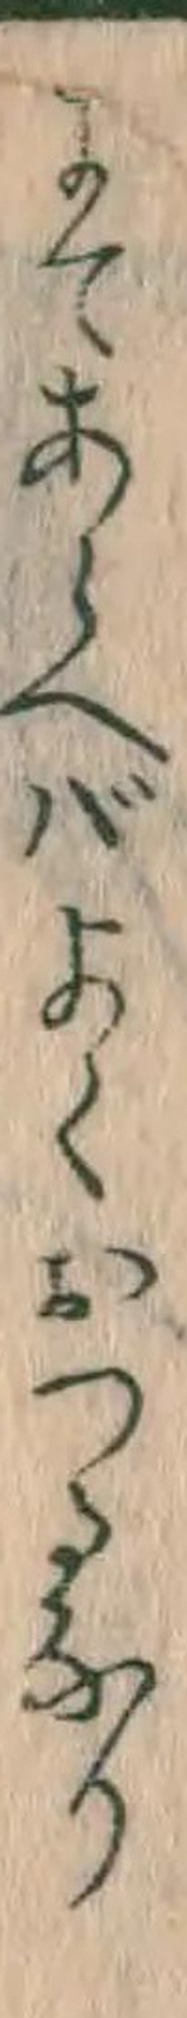にてあらへばよくおつるなり
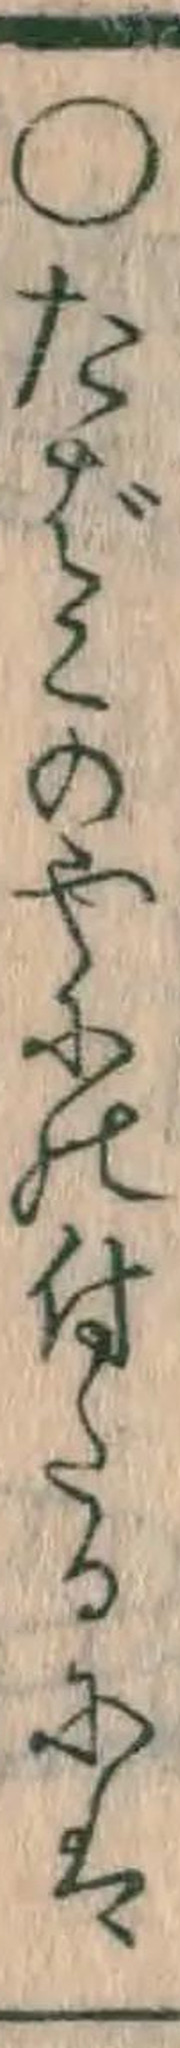○たばこのやにの付たるには
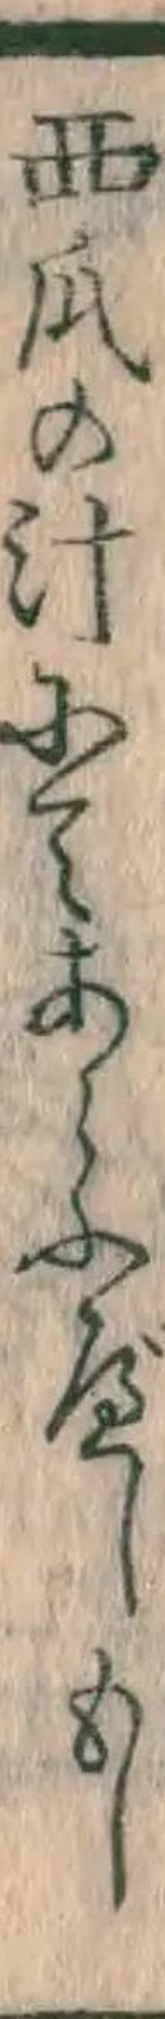西瓜の汁にてあらふべしもし
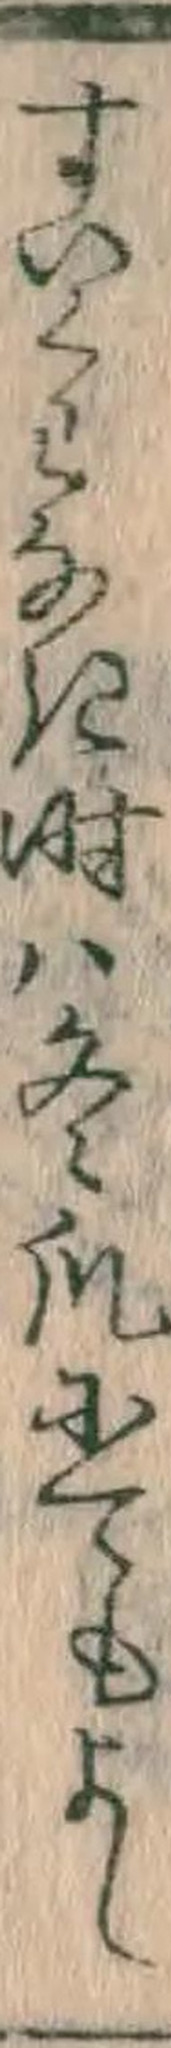すいくわなき時は冬瓜にてもよし
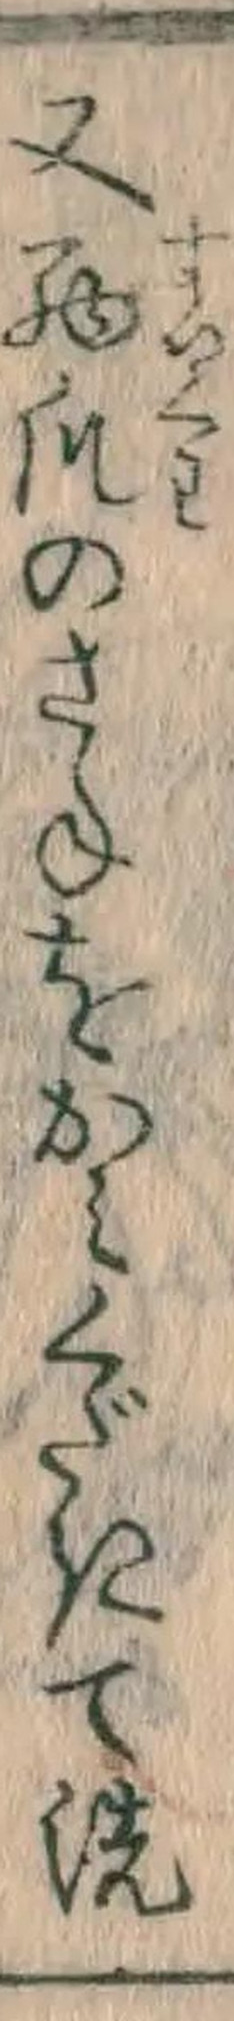又西瓜のさねをかみくだきて洗
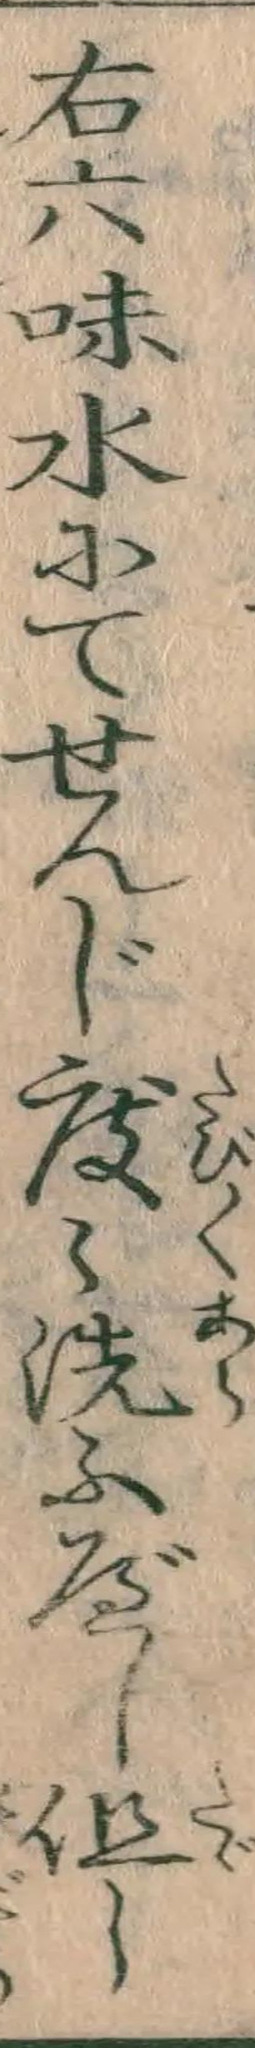右六味水にてせんじ度々洗ふべし但し
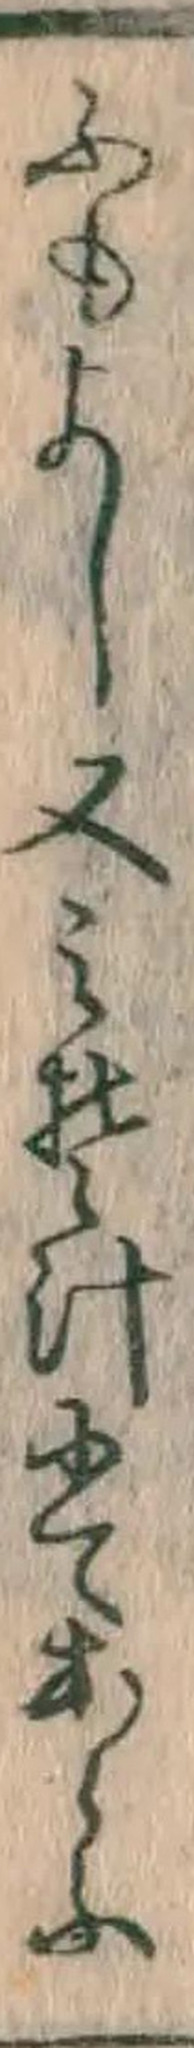ふもよし又みそ汁にてあらふ
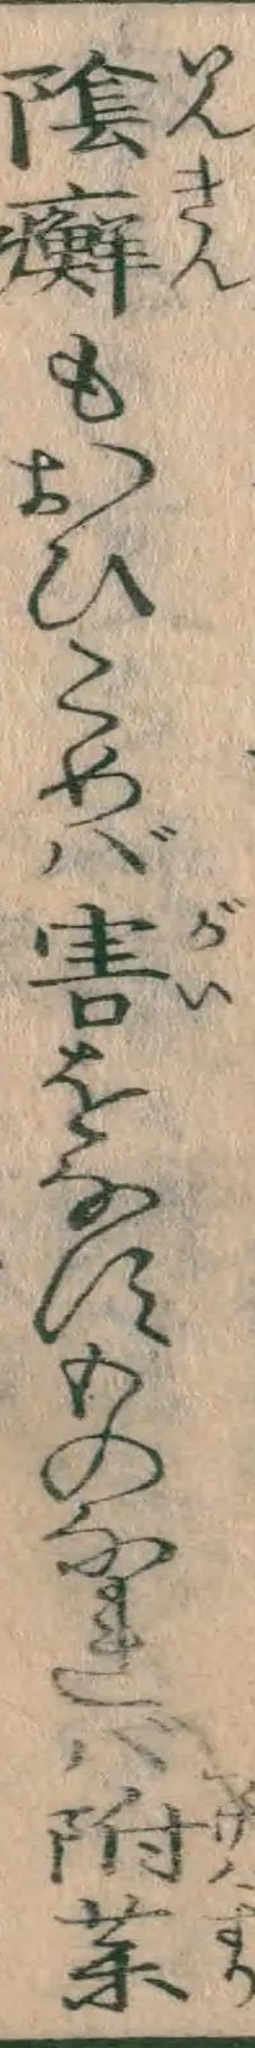陰癬もおひこめば害をなすものなれば附薬
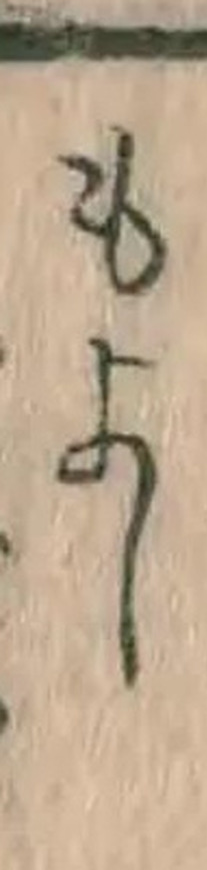もよし
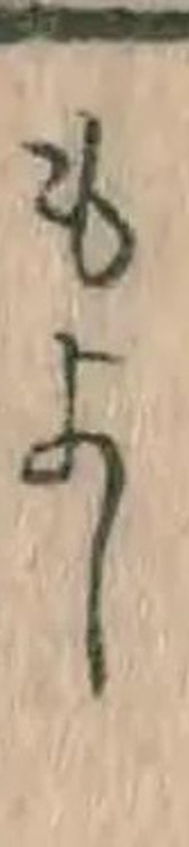もよし
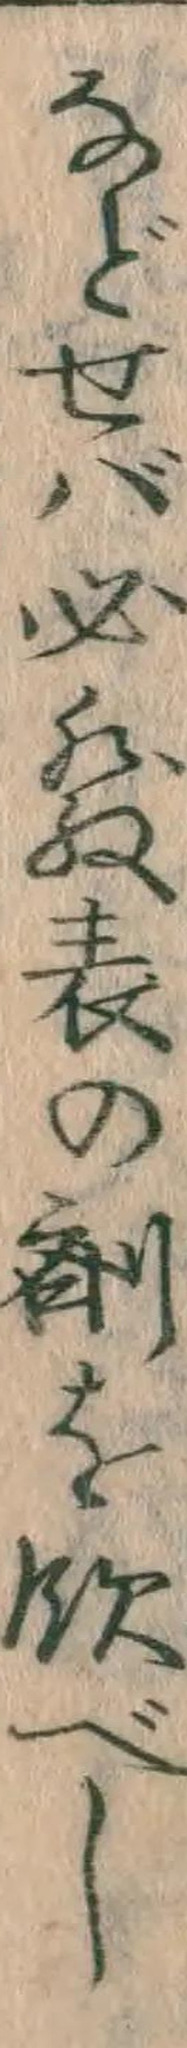などせば必発表の剤を飲べし
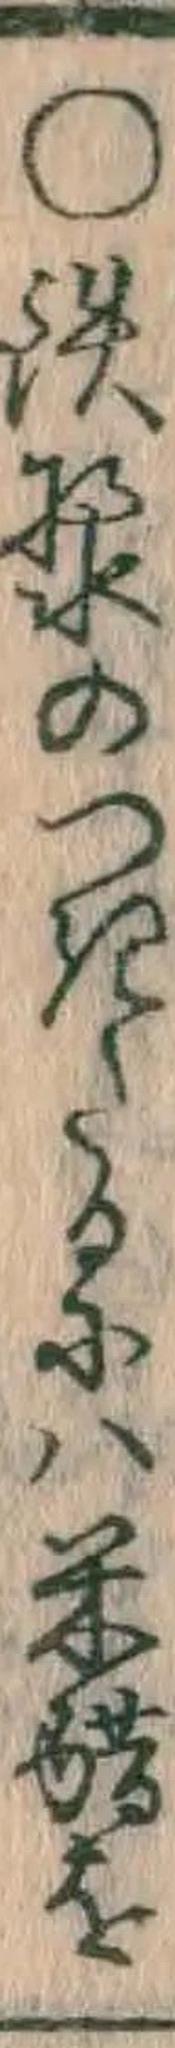○鉄漿のつきたるには米醋を
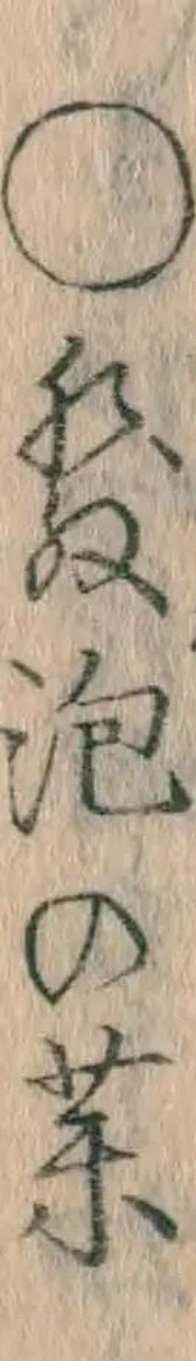○発泡の薬
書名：広益秘事大全 3巻. [3]
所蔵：国立国会図書館 National Diet Library, JAPAN
